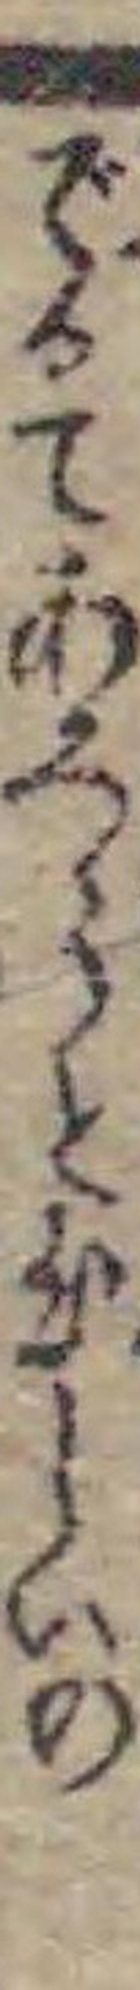でるであろうと玉しいの
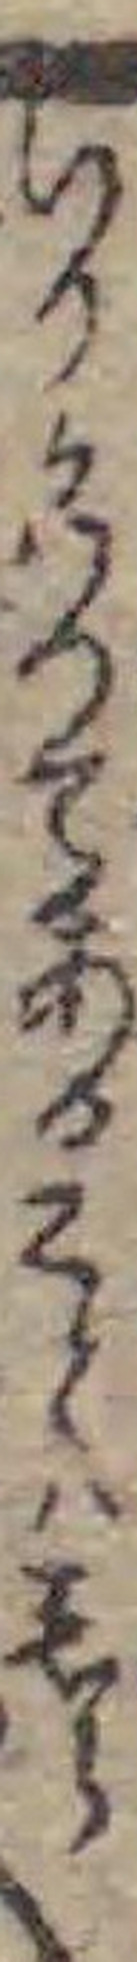いりかはつてあることはしら
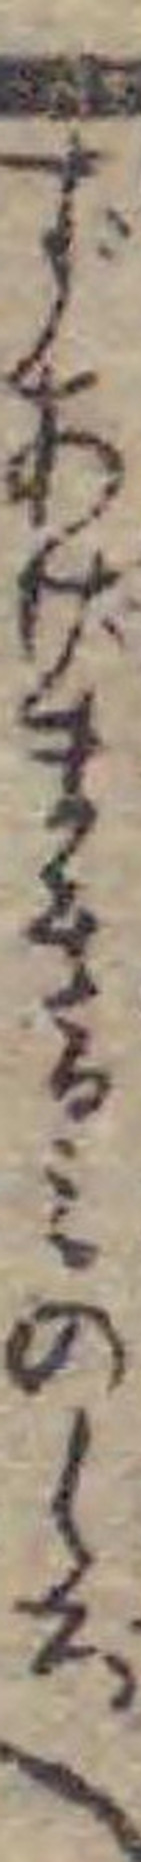ずあげまきかみのしろ
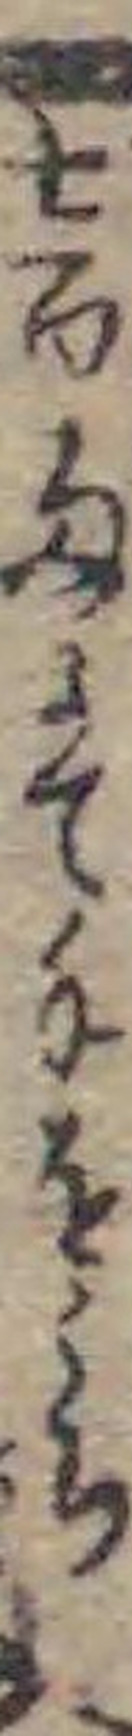七百両にて手をうち
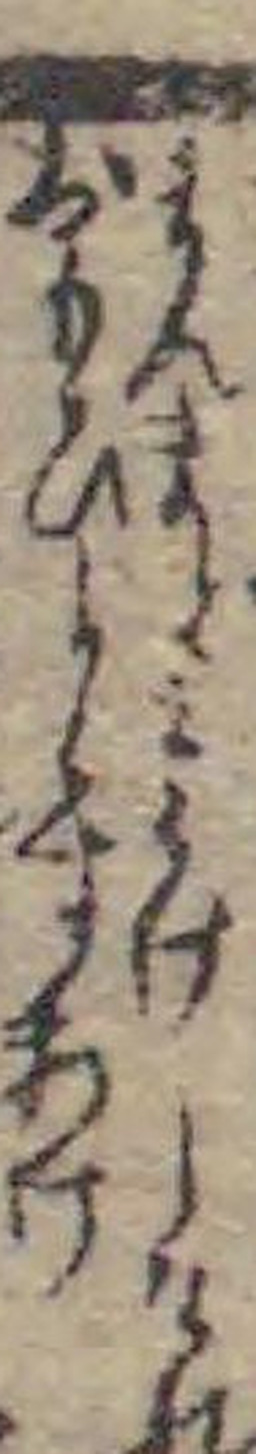おもひよらすあけ
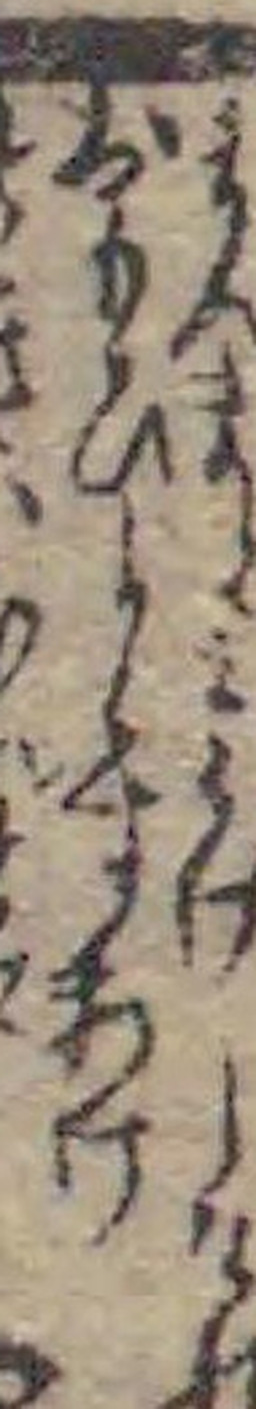おもひよらすあけ
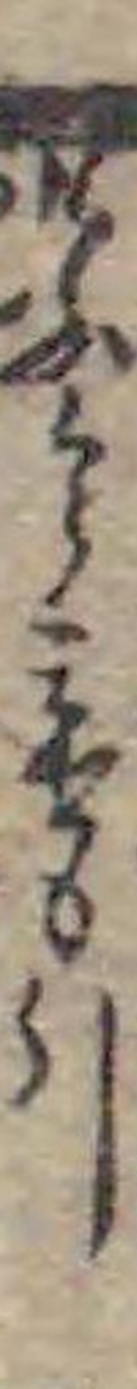けふくうみせも引
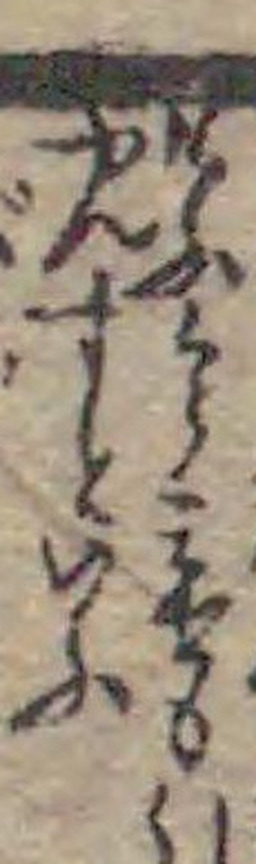やんすといふ
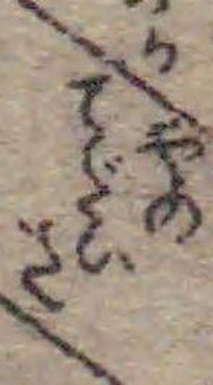てむき

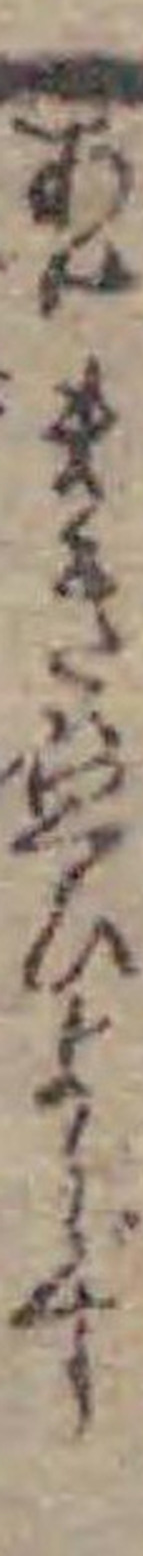あげまき思ひよらず
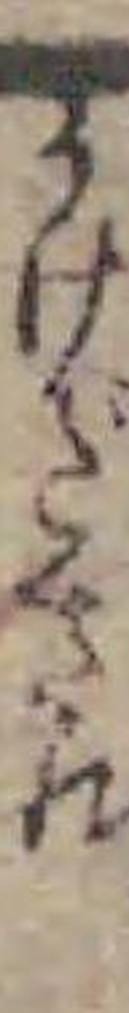うけだされ
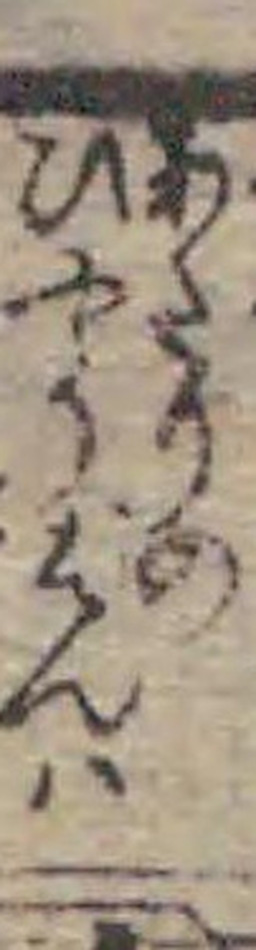ひやうばんは
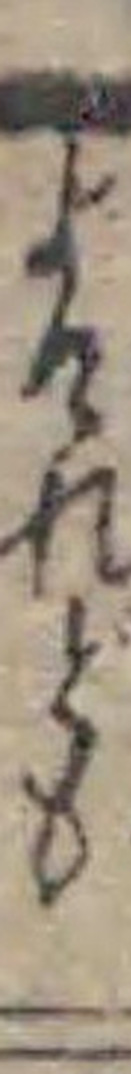よけれども
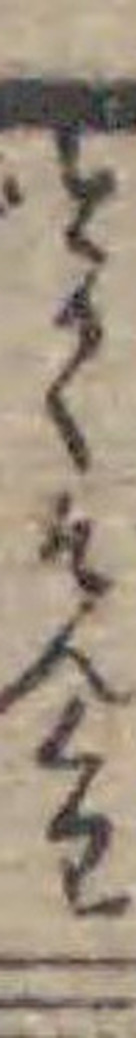とかくけんくわ
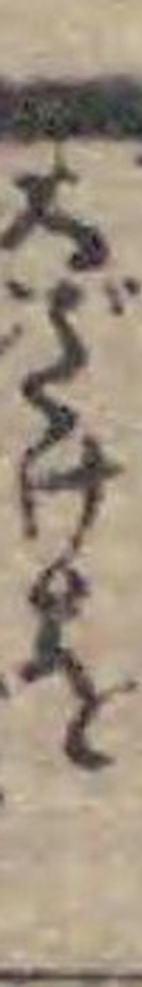大ざけを
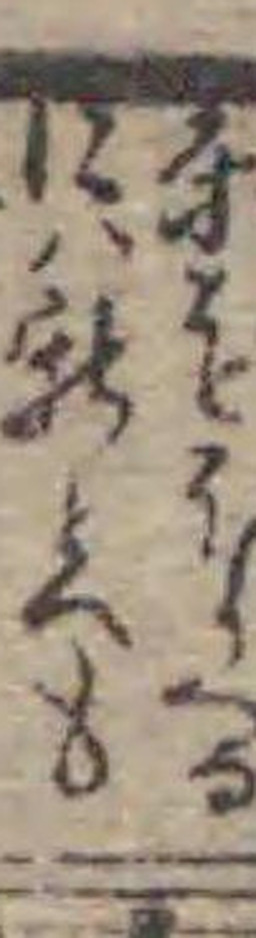には新兵へも
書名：江戸花俳優贔屓 : 3巻
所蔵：国立国会図書館 National Diet Library, JAPAN
